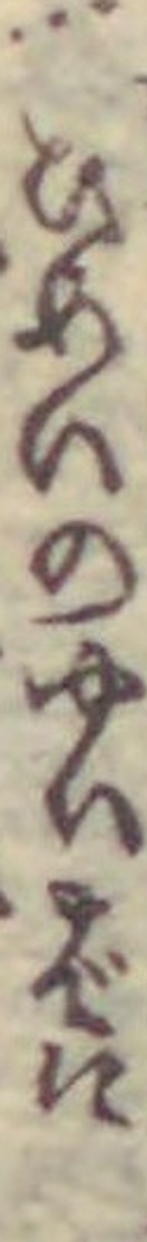ひめいのやいばに
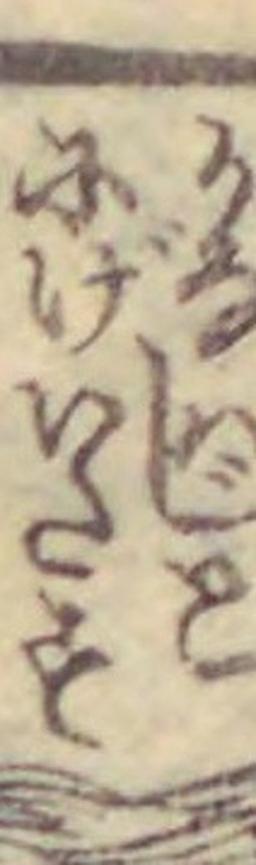にげいたす
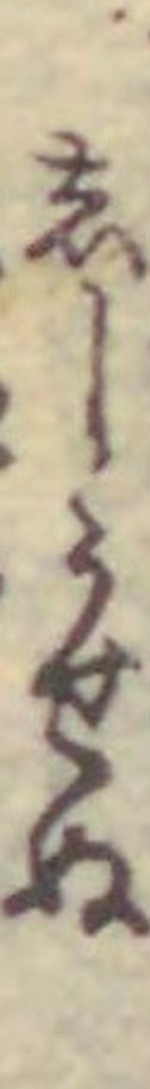ししうせぬ
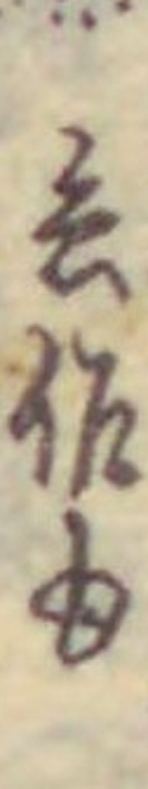兵作も
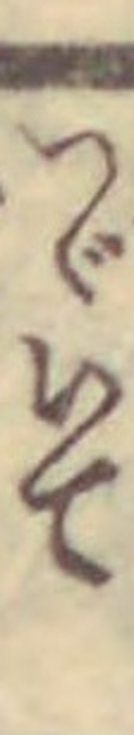つゞいて
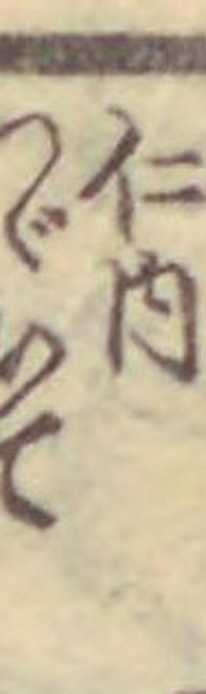つゞいて
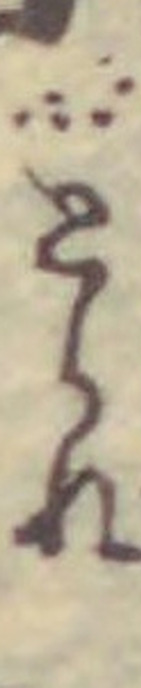とられ
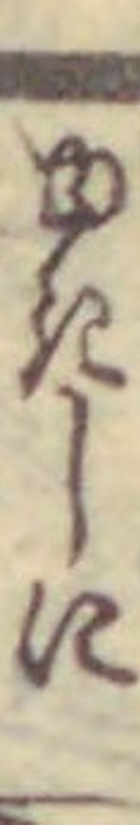ゆきしに
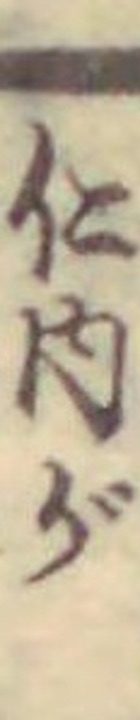仁内が
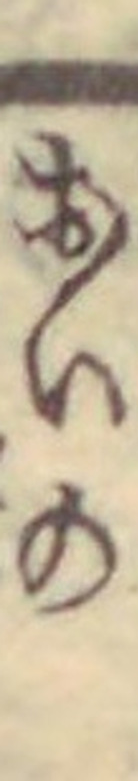おいの
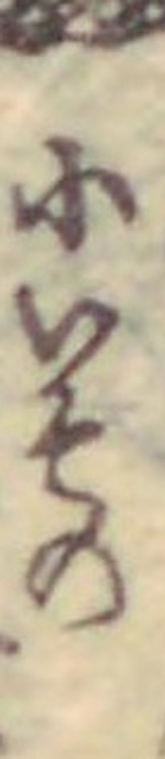小いその
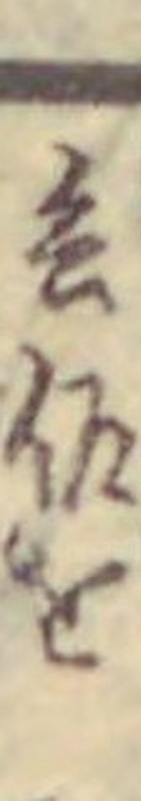兵作を
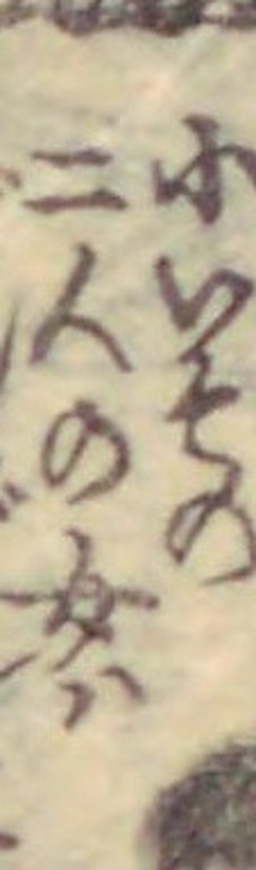二人の女は
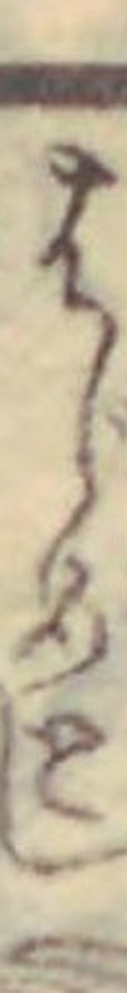はじめとし
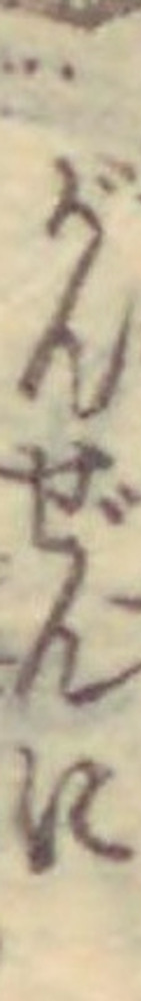がんぜんに
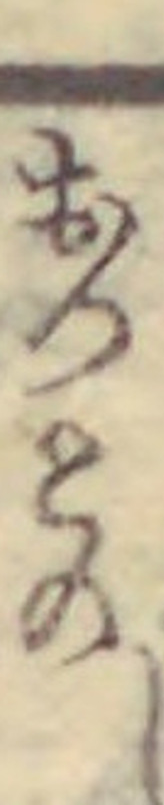おつとの
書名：八ツ目鱣因縁物語 3巻
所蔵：国立国会図書館 National Diet Library, JAPAN
